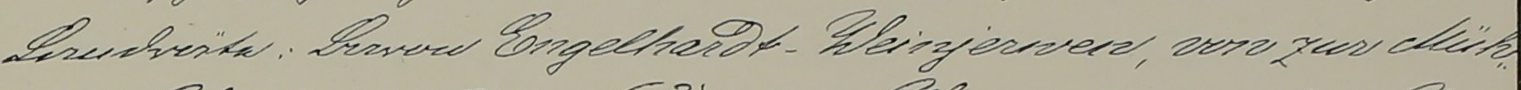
Landräte: Baron Engelhardt-Weinjerwen, von zur Müh-
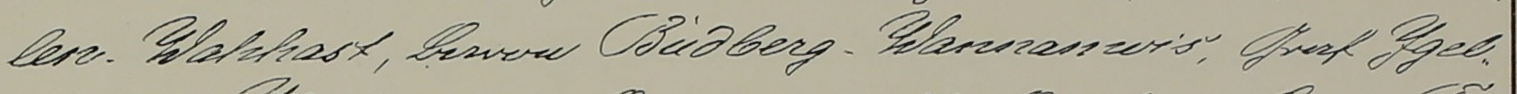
len-Wahhast, Baron Budberg-Wannamois, Graf Igel-
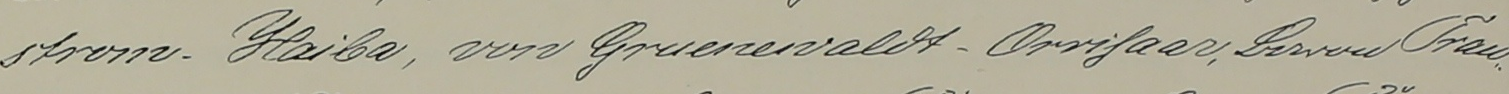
strom-Haiba, von Gruenewaldt-Orrisaar, Baron Trau.
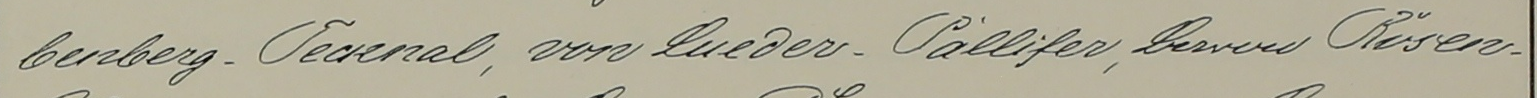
benberg-Tecknal, von Lueder-Pallifer, Baron Rosen-
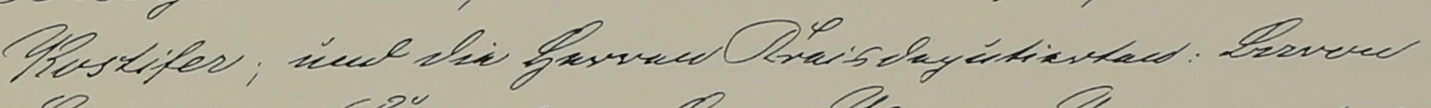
Kostifer; und die Herren Kreisdeputierten Baron
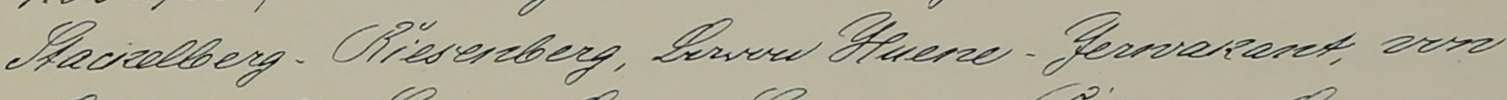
Stackelberg-Riesenberg, Baron Huene-Jerwakant, von
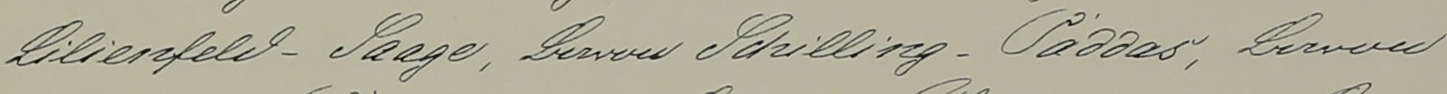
Lilienfeld-Saage, Baron Schilling-Paddas, Baron
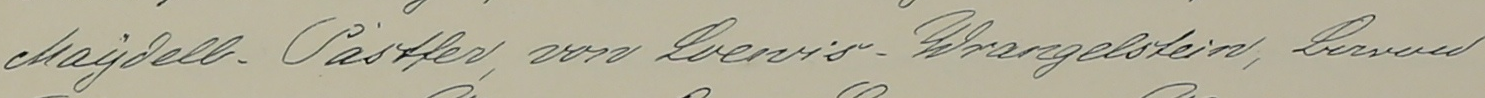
Maydell-Pastfer, von Loewis-Wrangelstein, Baron
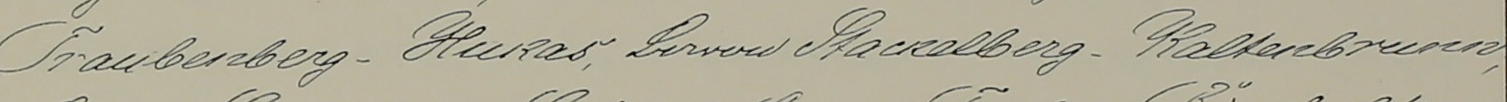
Traubenberg-Hukas, Baron Stackelberg-Kaltenbrunn,
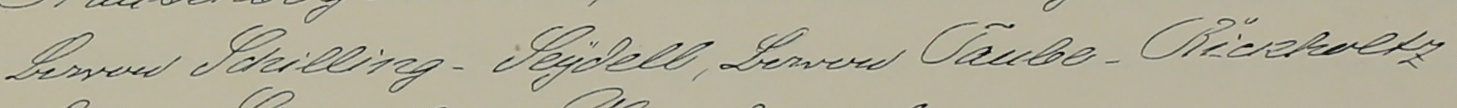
Baron Schilling-Seydell, Baron Taube-Rickholtz,
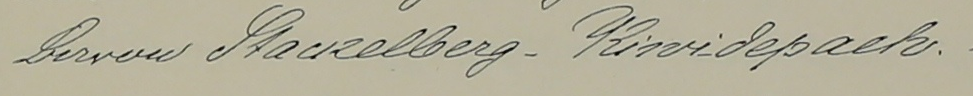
Baron Stackelberg-Kiwidepaeh.
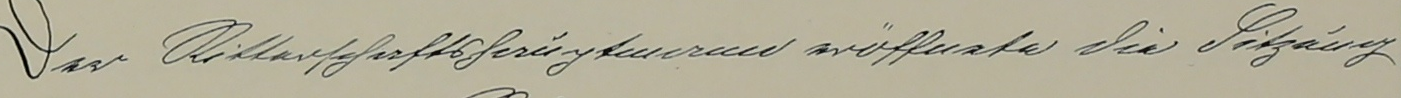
Der Ritterschaftshauptmann eröffnete die Sitzung
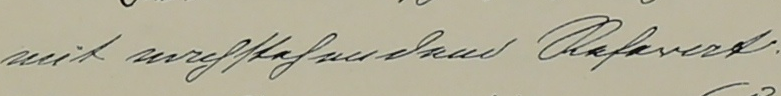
mit nachstehendem Referat:
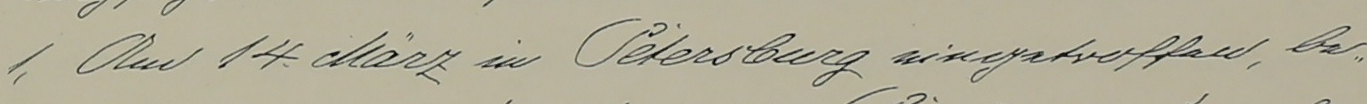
1. Am 14. März in Petersburg eingetroffen, be-
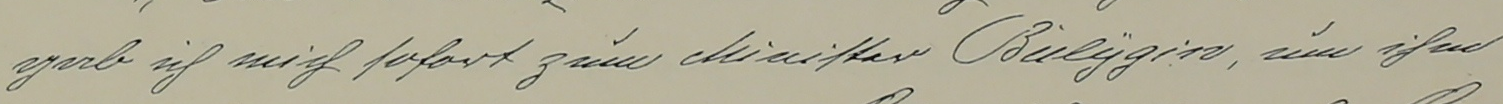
gab ich mich sofort zum Minister Bulygin, um ihm
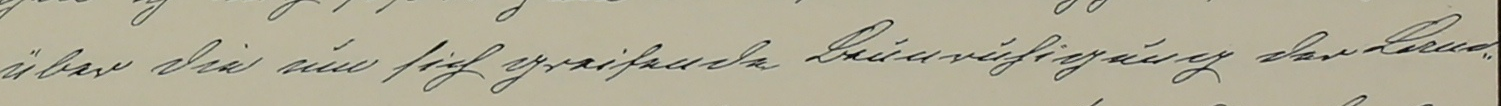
über die um sich greifende Beunruhigung der Land-
